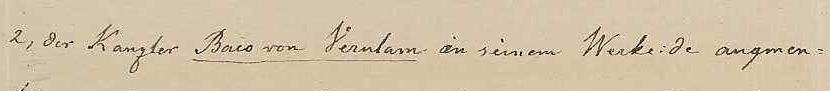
2, der Kanzler Baco von Verulam in seinem Werke: de augmen-
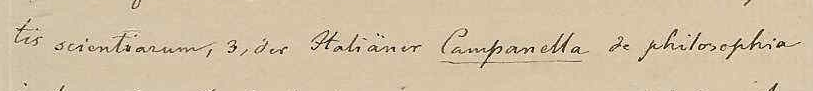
tis scientiarum, 3, der Italiäner Campanella de philosophia
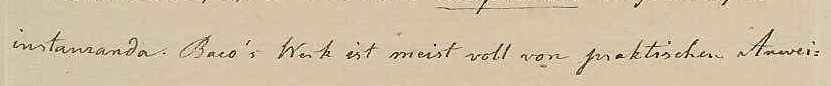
instauranda. Baco's Werk ist meist voll von praktischen Anwei-
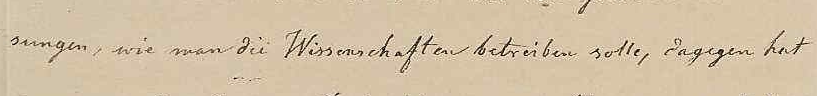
sungen, wie man die Wissenschaften betreiben solle, dagegen hat
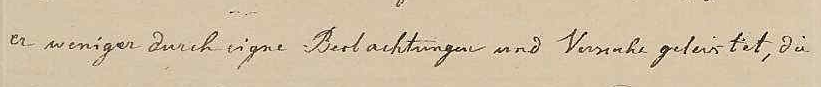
er weniger durch eigne Beobachtungen und Versuche geleistet, die
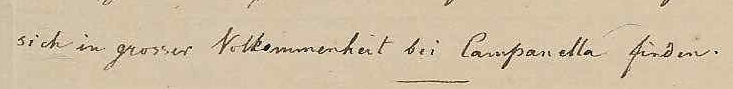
sich in grosser Volkommenheit bei Campanella finden.
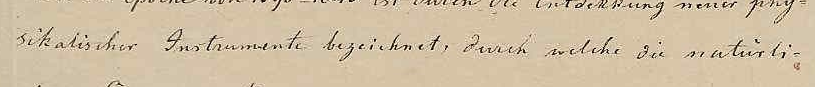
sikalischer Instrumente bezeichnet, durch welche die natürli-
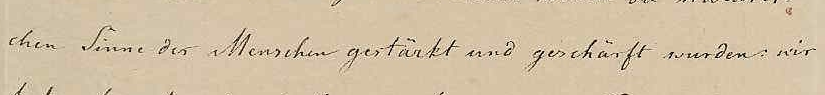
chen Sinne des Menschen gestärkt und geschärft wurden: wir
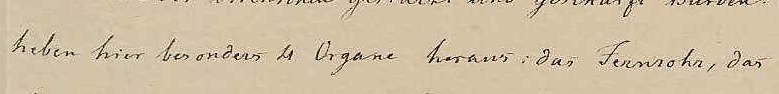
heben hier besonders 4 Organe heraus: das Fernrohr, das
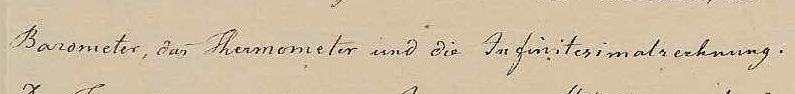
Barometer, das Thermometer und die Infinitesimalrechnung.
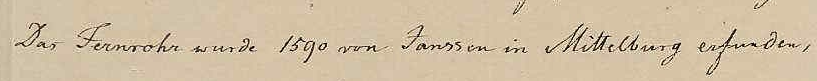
Das Fernrohr wurde 1590 von Janssen in Mittelburg erfunden,
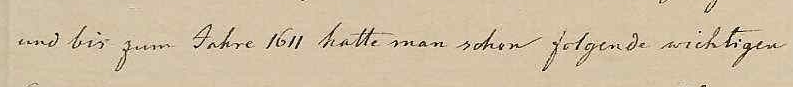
und bis zum Jahre 1611 hatte man schon folgende wichtigen
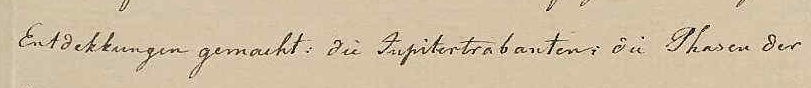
Entdekkungen gemacht: die Jupitertrabanten: die Phasen der
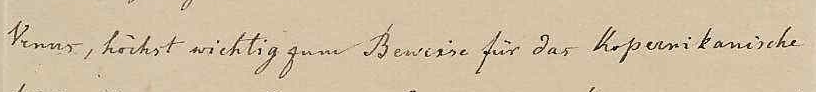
Venus, höchst wichtig zum Beweise für das Kopernikanische
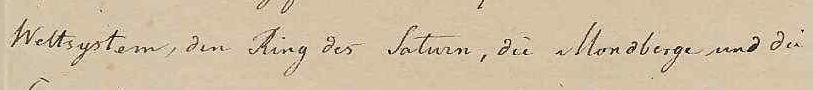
Weltsystem, den Ring des Saturn, die Mondberge und die
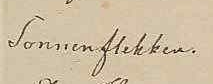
Sonnenflekken.
